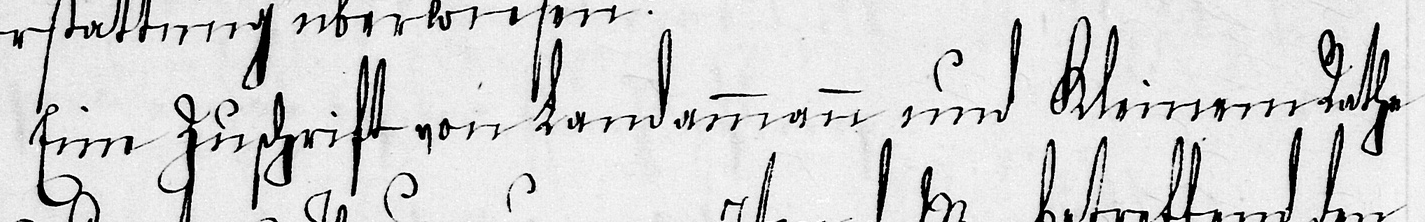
Eine Zuschrift von Landammann und Kleinem Rathe
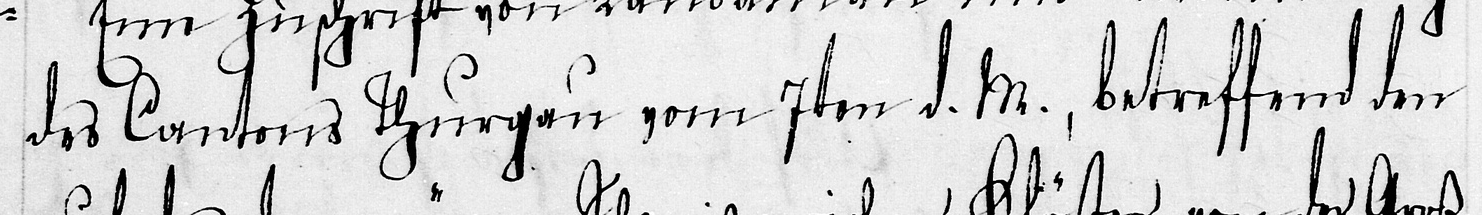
des Cantons Thurgau vom 7ten d. M., betreffend den
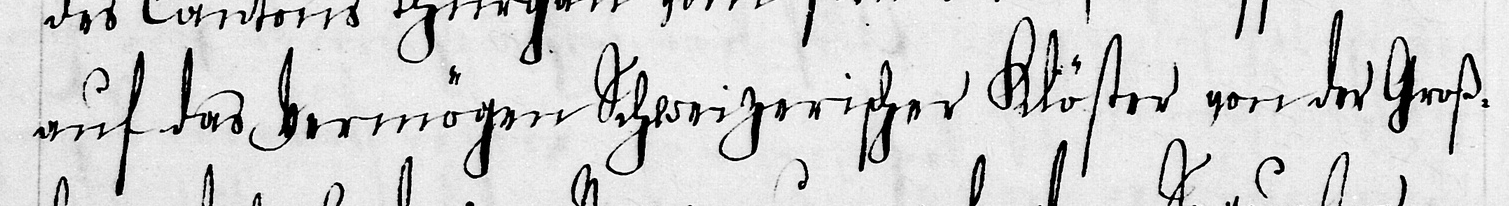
auf das Vermögen Schweizerischer Klöster von der Groß¬
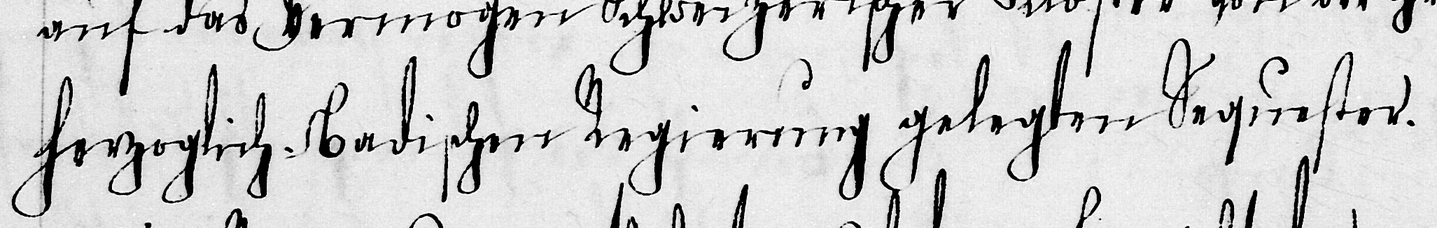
herzoglich-Badischen Regierung gelegten Sequester.
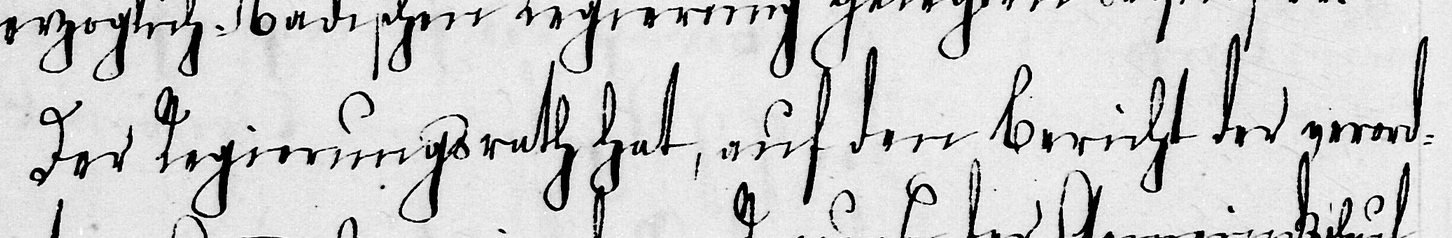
Der Regierungsrath hat, auf den Bericht der veror¬
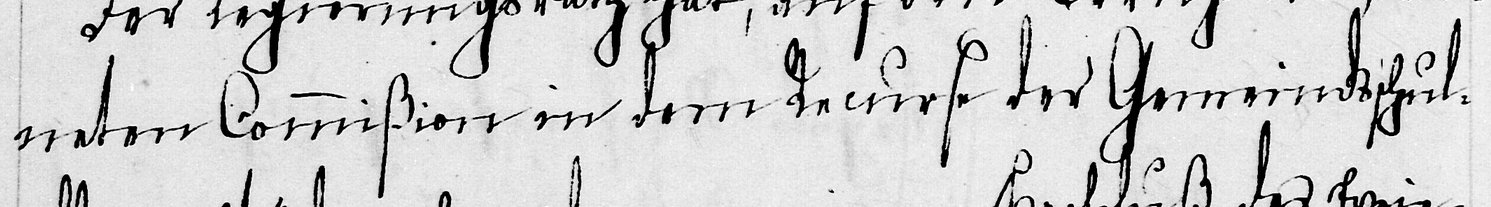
dneten Commißion in dem Recurse der Gemeindsschul¬
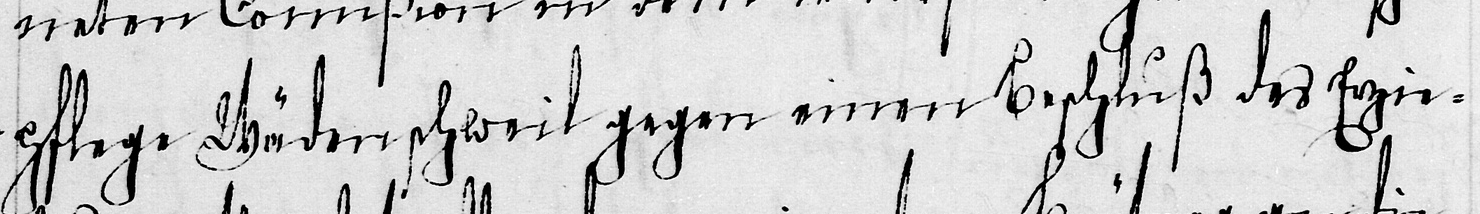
pflege Wädenschweil gegen einen Beschluß des Erzie¬
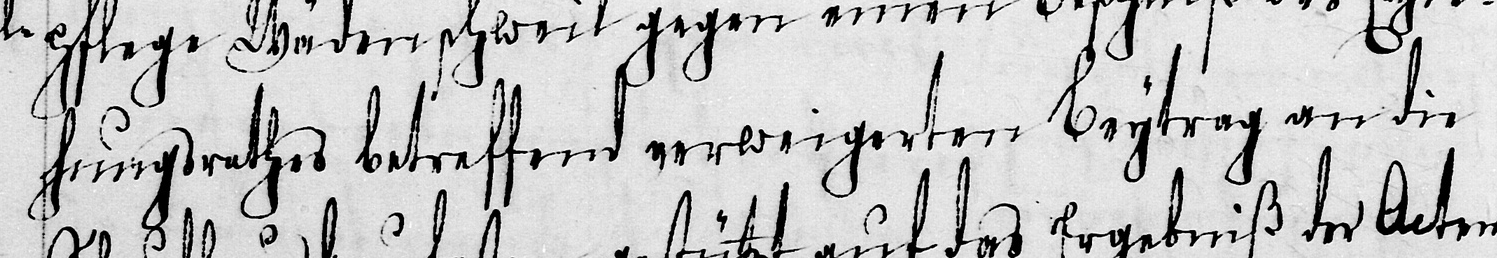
hungsrathes betreffend verweigerten Beytrag an die
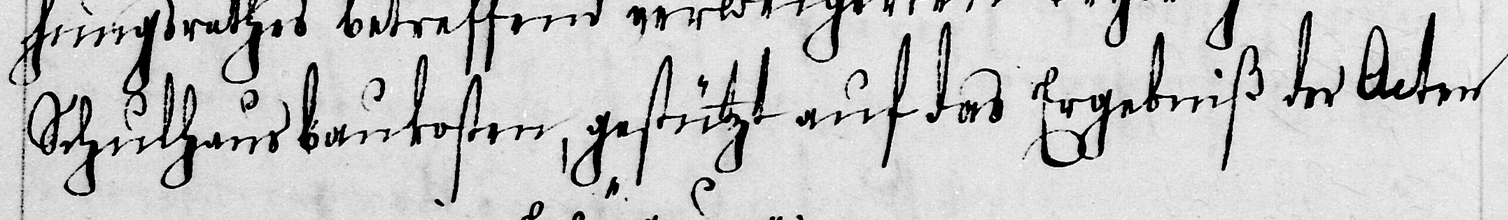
Schulhausbaukosten, gestützt auf das Ergebniß der Acten
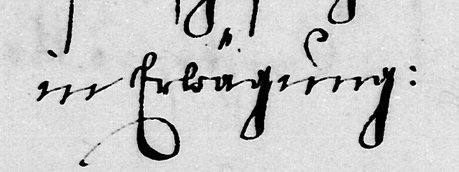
in Erwägung:
